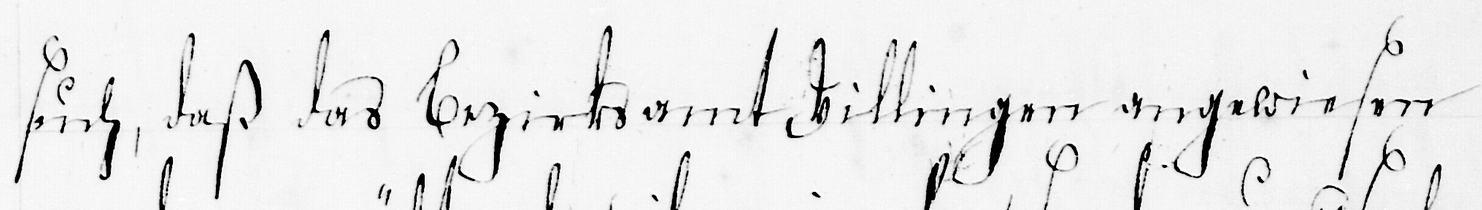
such, daß das Bezirksamt Villingen angewiesen
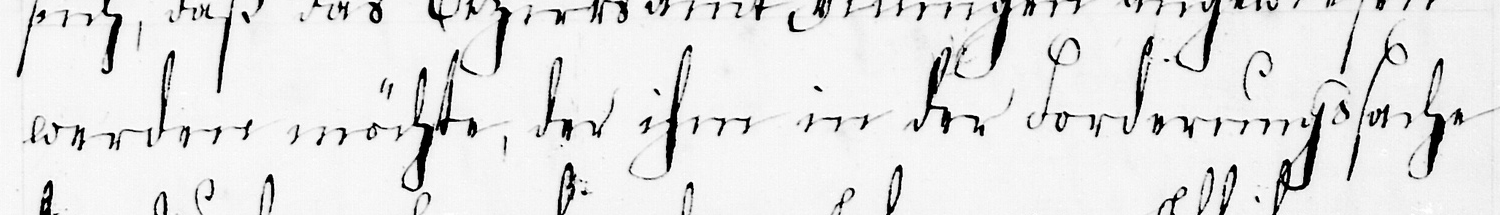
werden möchte, der ihm in der Forderungssache
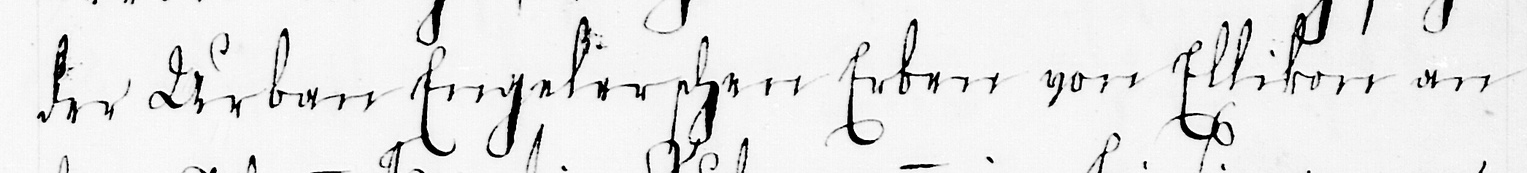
der Urban Engelerschen Erben von Ellikon an
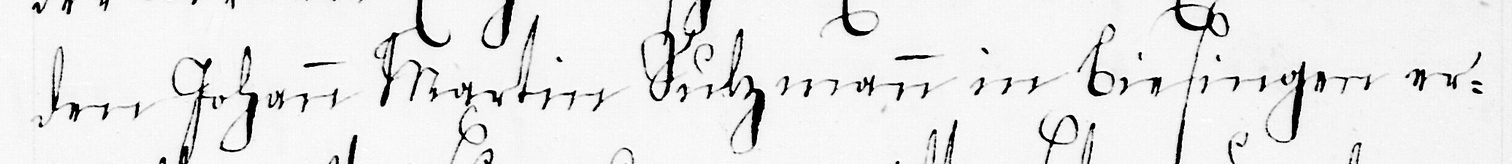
den Johann Martin Sulzmann in Biesingen er¬
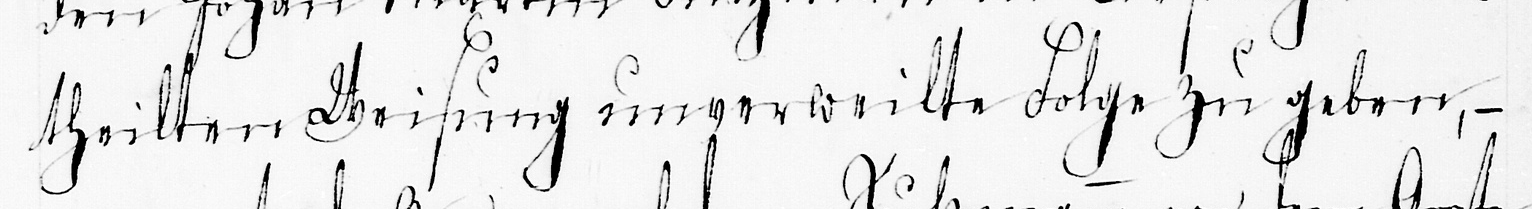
theilten Weisung unverweilte Folge zu geben, –
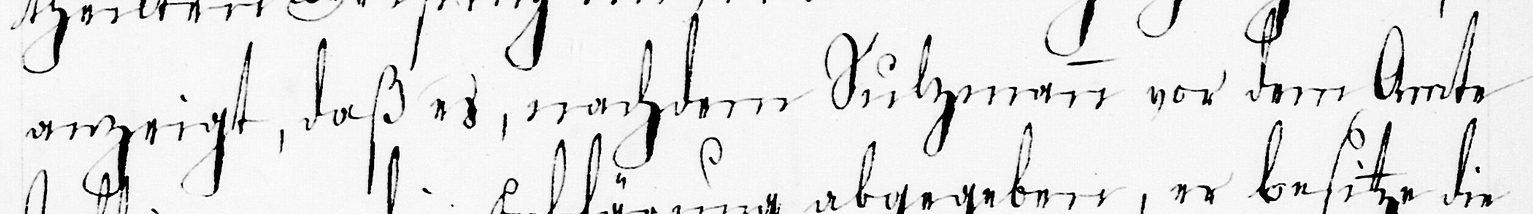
angezeigt, daß es, nachdem Sulzmann vor dem Amte
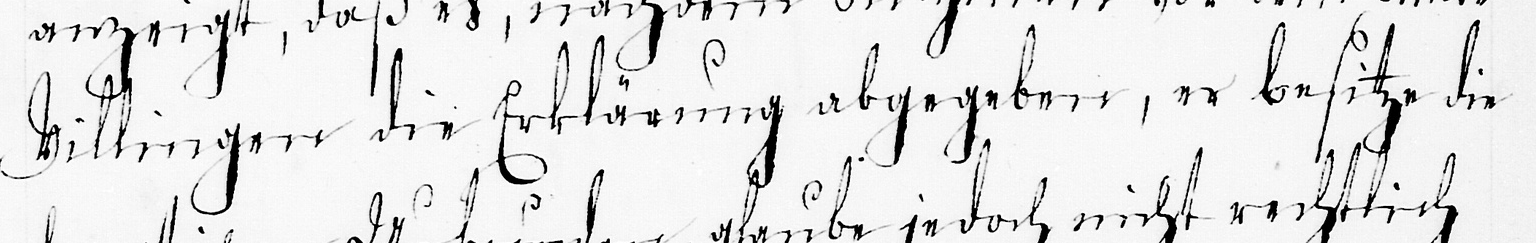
Villingen die Erklärung abgegeben, er besitze die
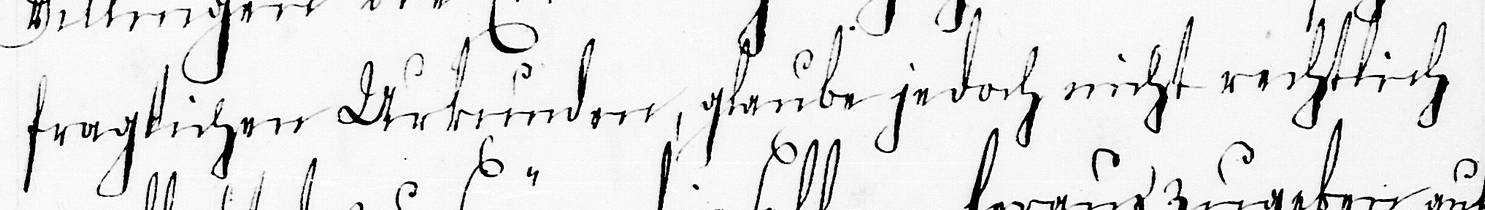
fraglichen Urkunden, glaube jedoch nicht rechtlich
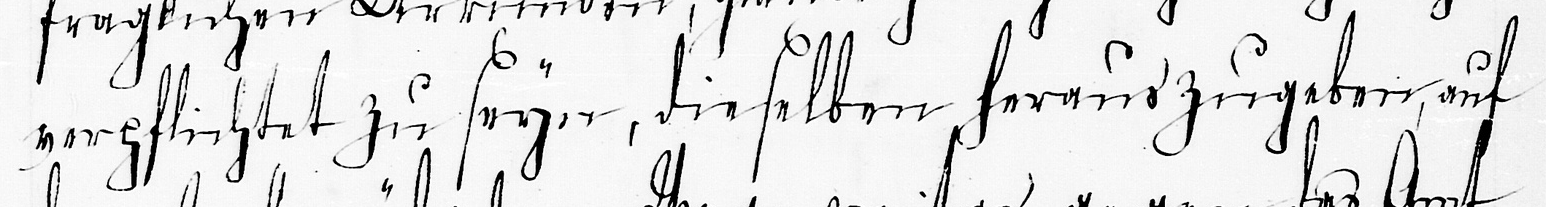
verpflichtet zu seyn, dieselben herauszugeben, auf
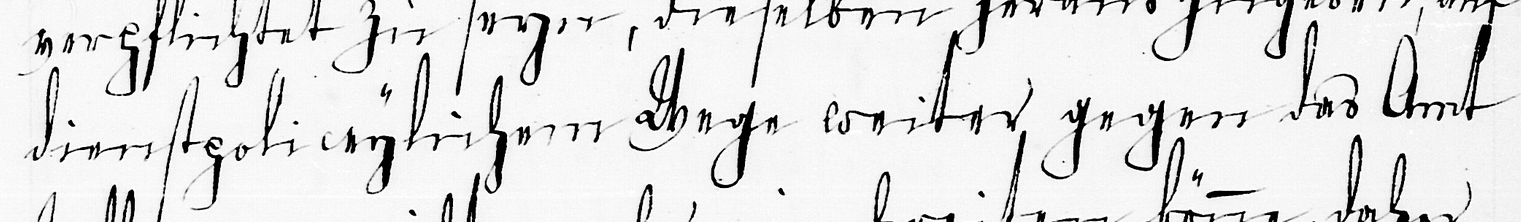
dienstpoliceylichem Wege weiter gegen das Amt
